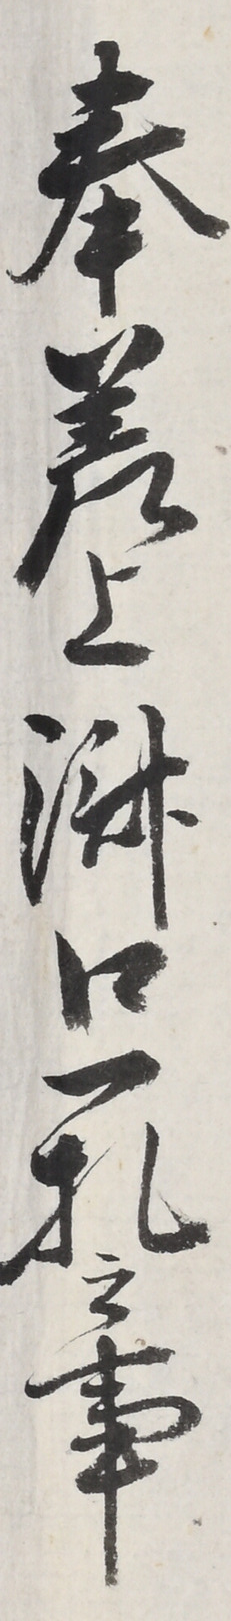奉差上済口一札之事
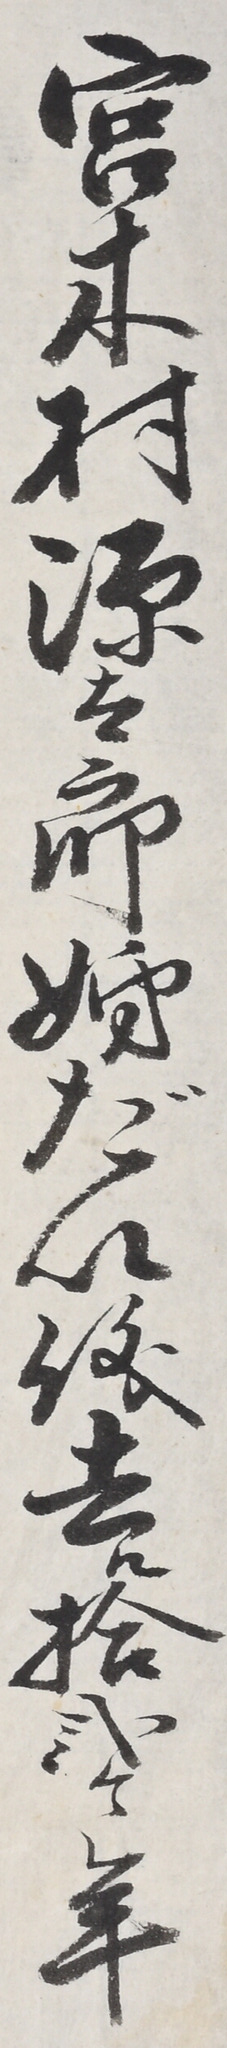宮木村源太郎姉だい儀去る拾弐ヶ年
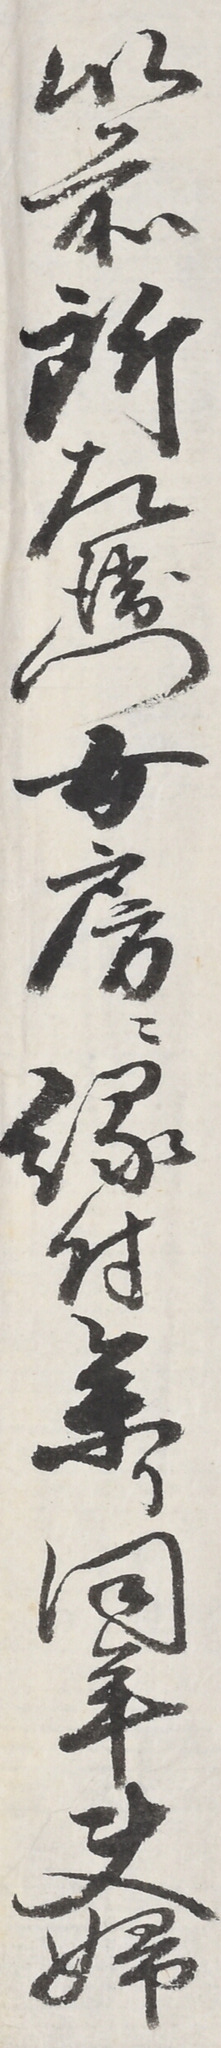以前所左衛門女房ニ縁付参り同年夫婦
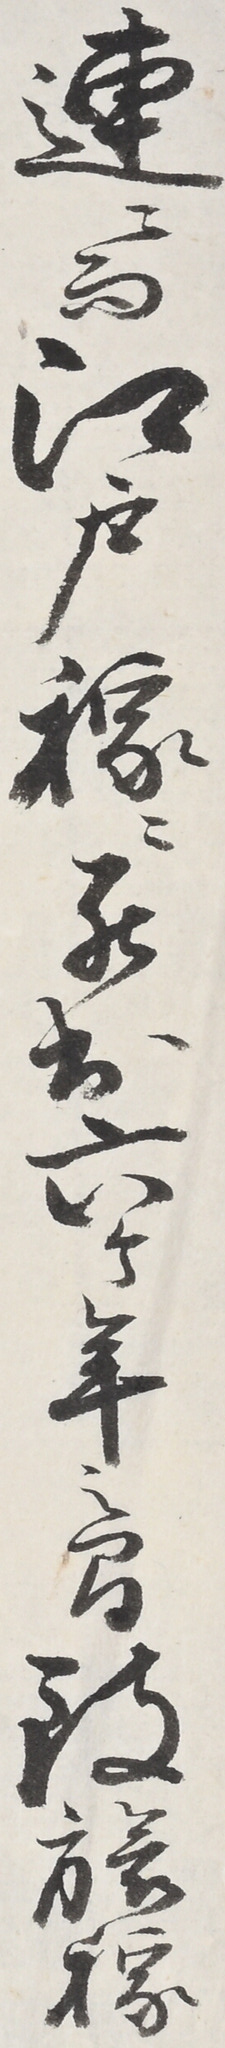連ニ而江戸稼ニ罷出六ケ年之間致旅稼
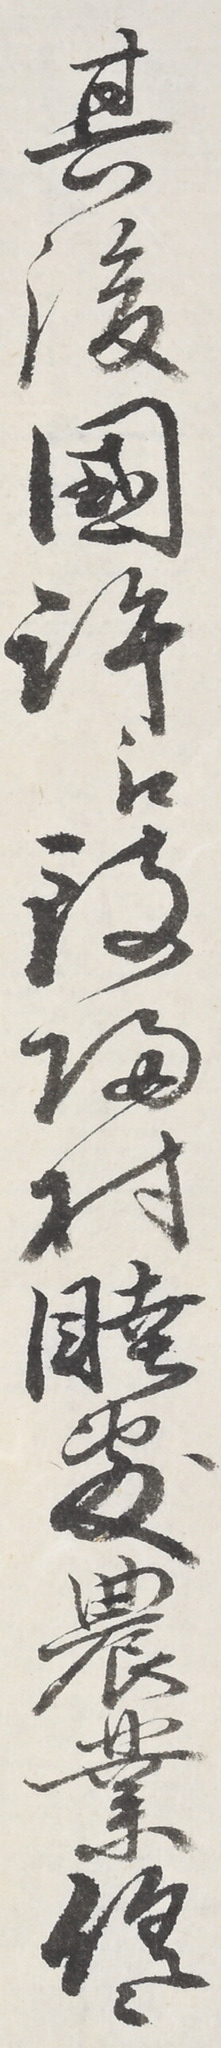其後国許江致帰村睦敷農業倶々
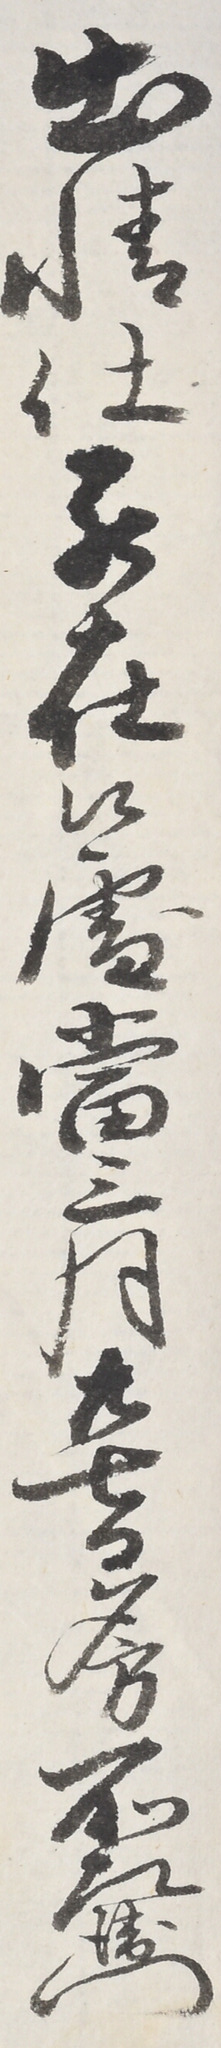出精仕罷在候處当三月廿七日夕方所左衛門
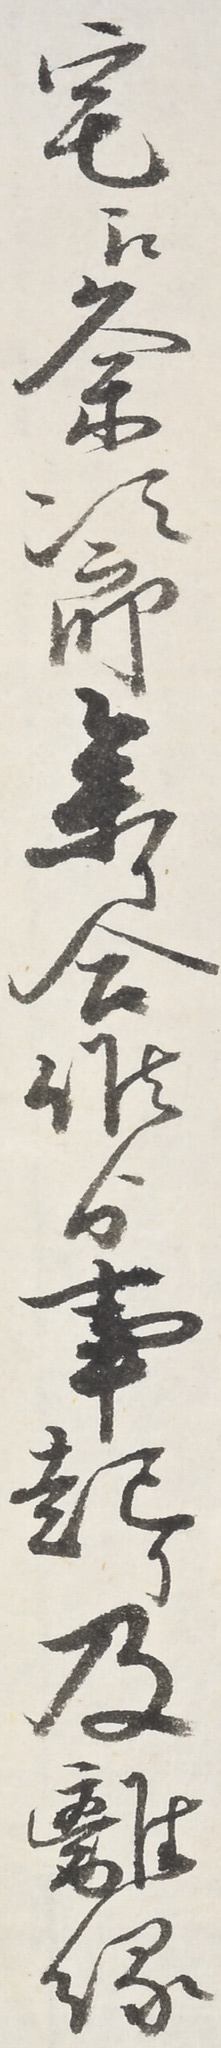宅江粂次郎参り合候ゟ事起り及離縁
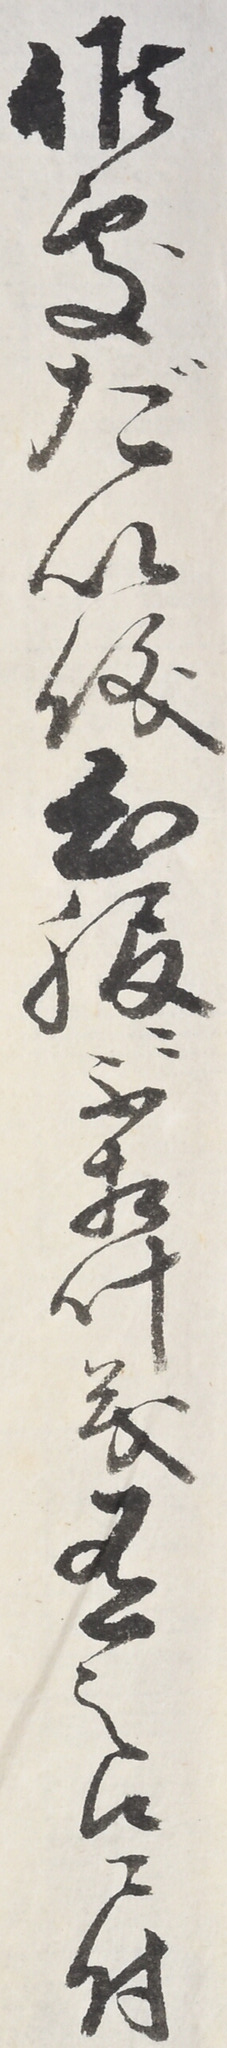候処だい儀心服ニ不相叶義有之候ニ付
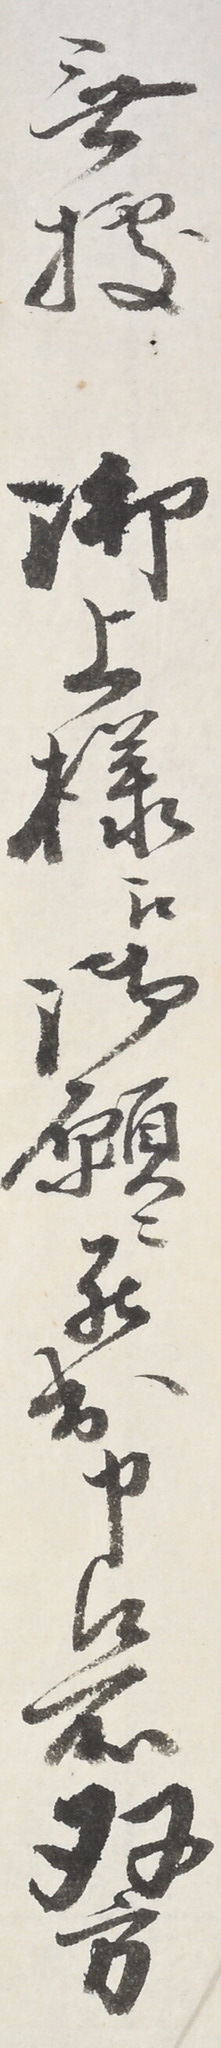無拠御上様江御願ニ罷出申候所双方
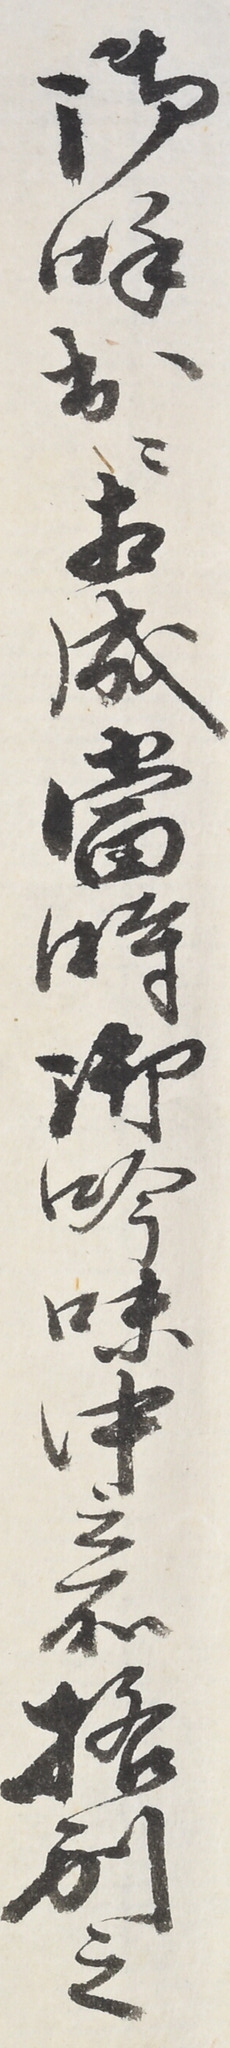御呼出ニ相成当時御吟味中之所格別之
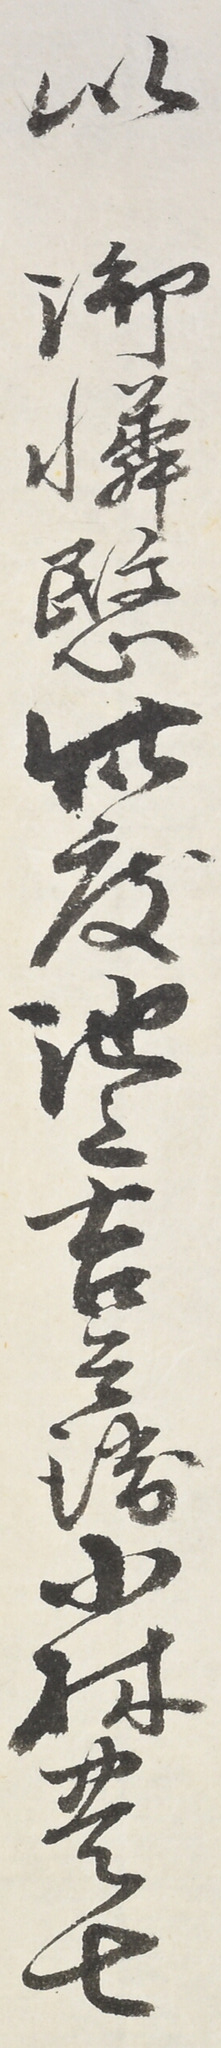以御憐愍此度池上吉兵衛小林豊七
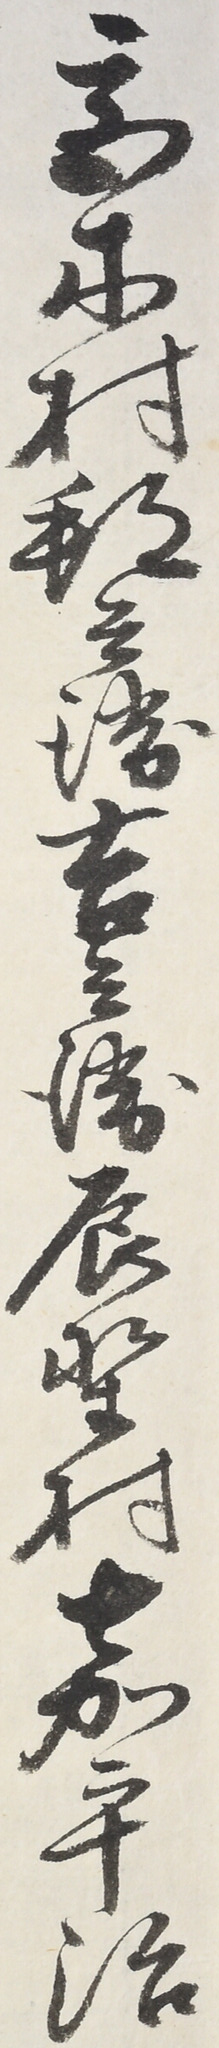宮木村邦兵衛吉兵衛辰野村嘉平治
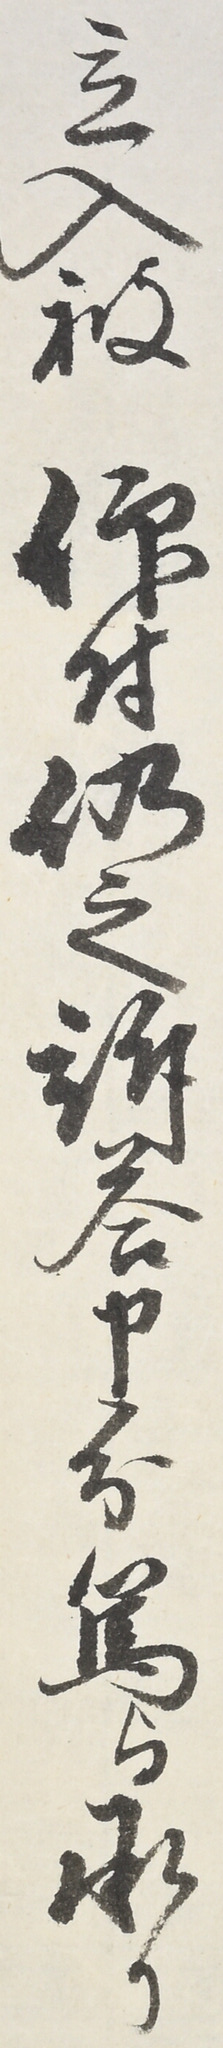立入被仰付仍之訴答申分篤と承り
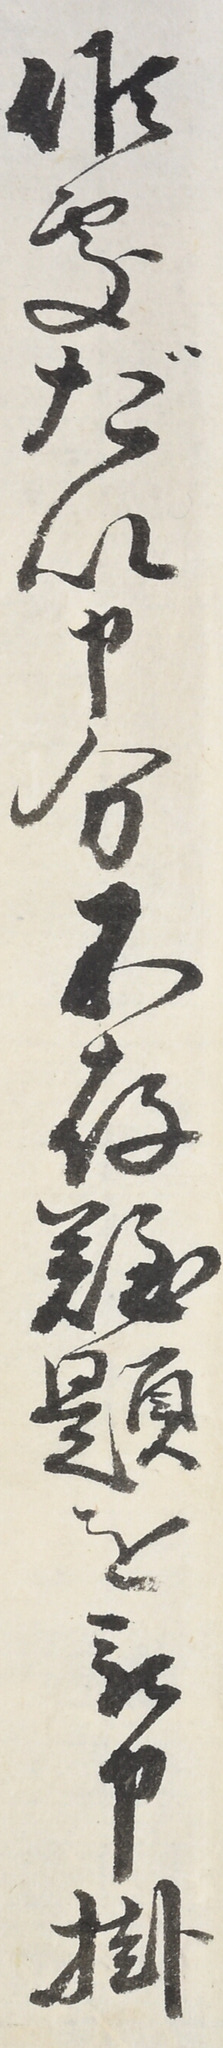候処だい申分不存難題を被申掛
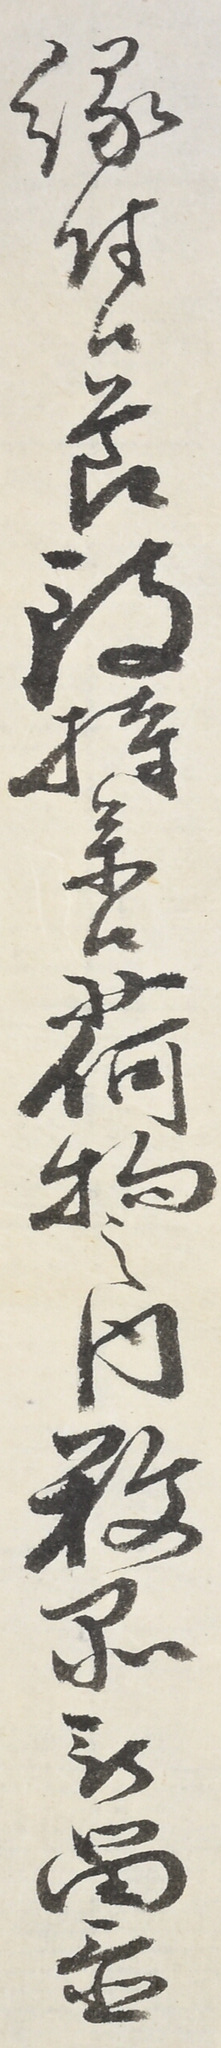縁付候節致持参候荷物之内数品被留置
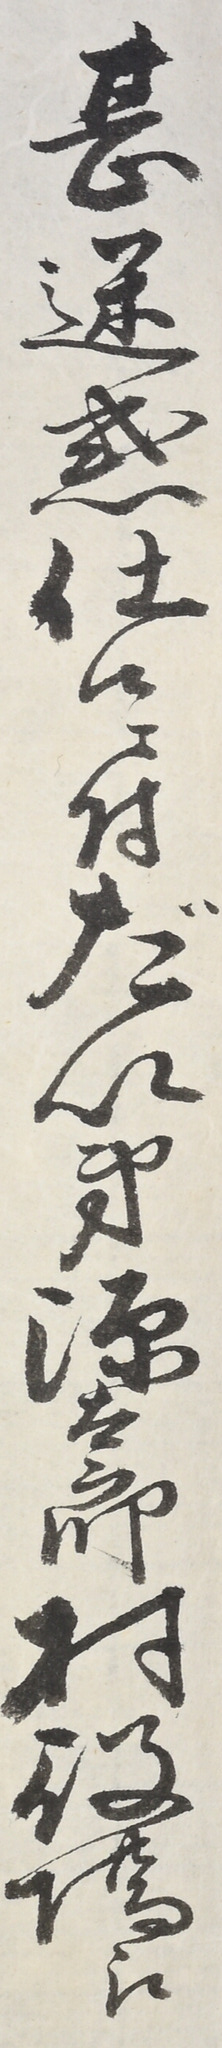甚迷惑仕候ニ付だい弟源太郎村役場江
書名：奉差上済口一札之事
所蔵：伊那市立高遠町図書館・合同会社AMANE
